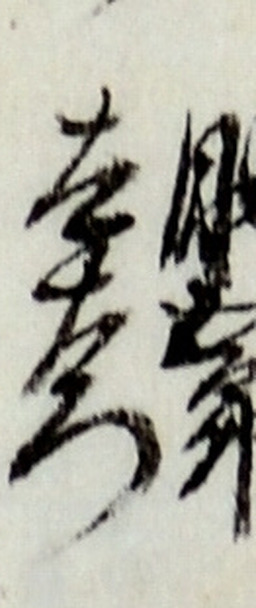兵右衛門
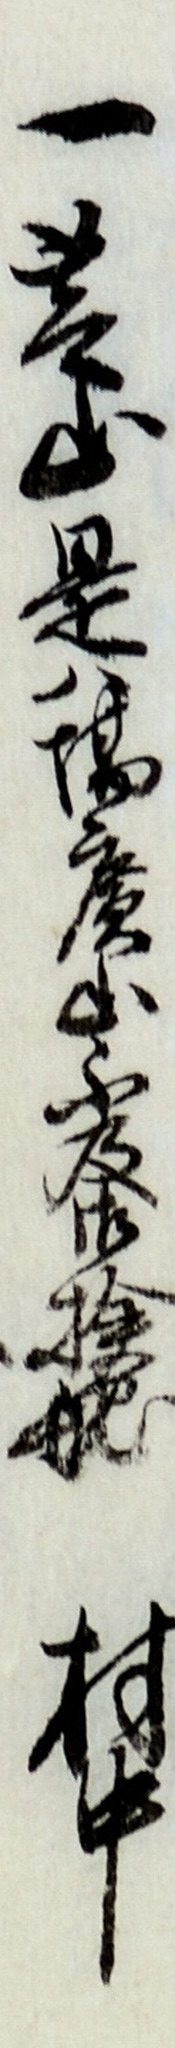一芝山是ハ場広山不及御検地村中
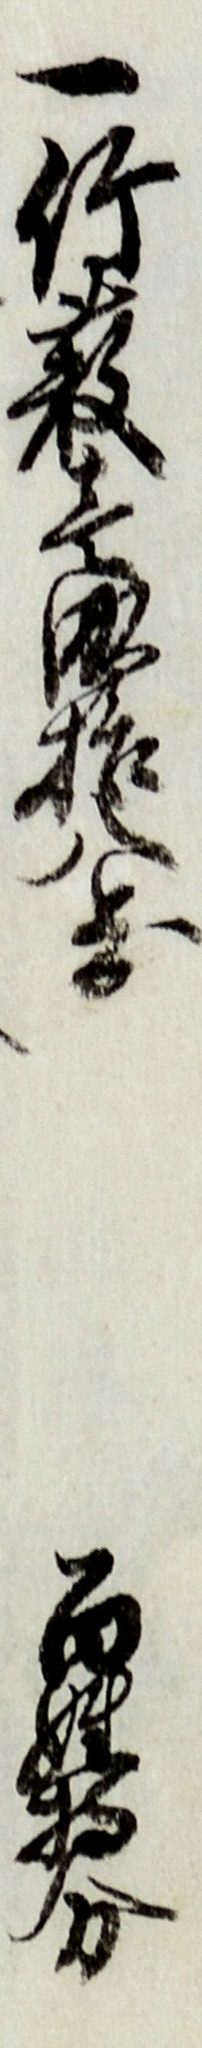一竹藪壱畝拾八歩百姓持分
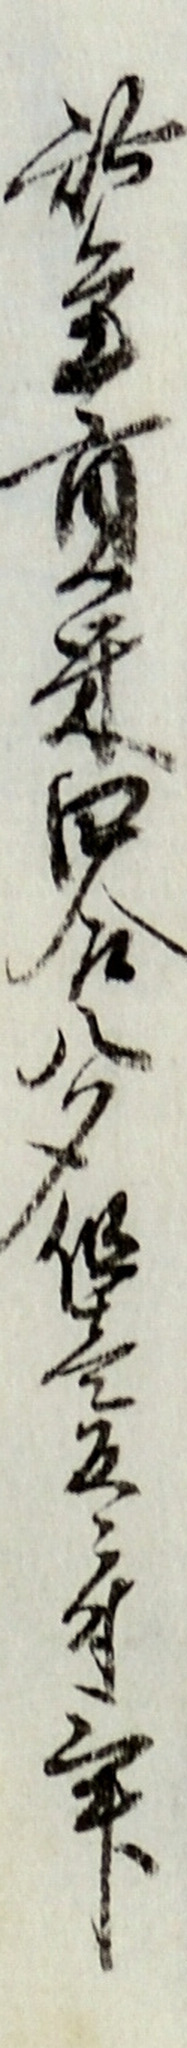此年貢米四合八勺但壱反ニ付三升
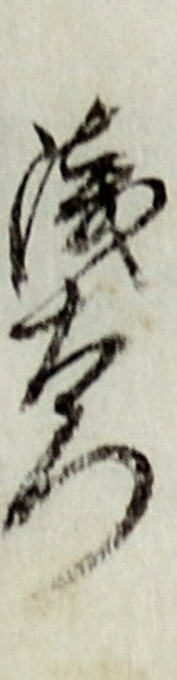兵右衛門
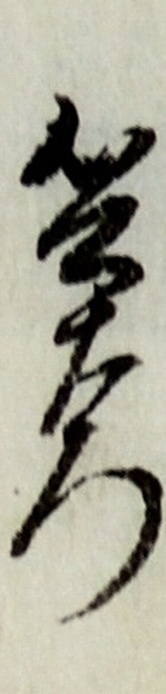兵右衛門

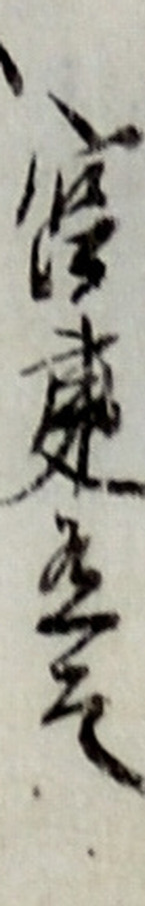宮建有之
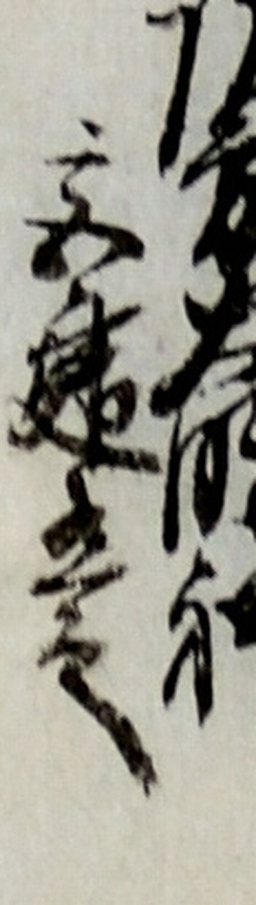宮建有之
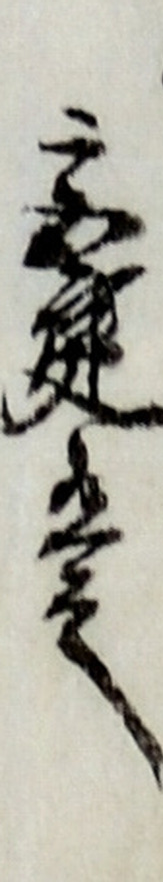宮建有之
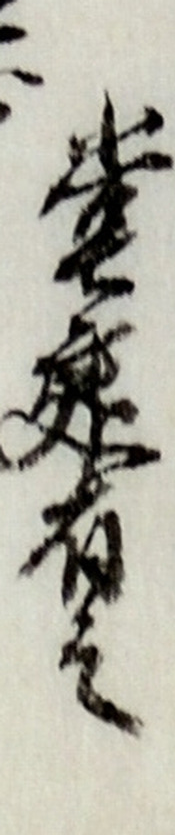堂建有之
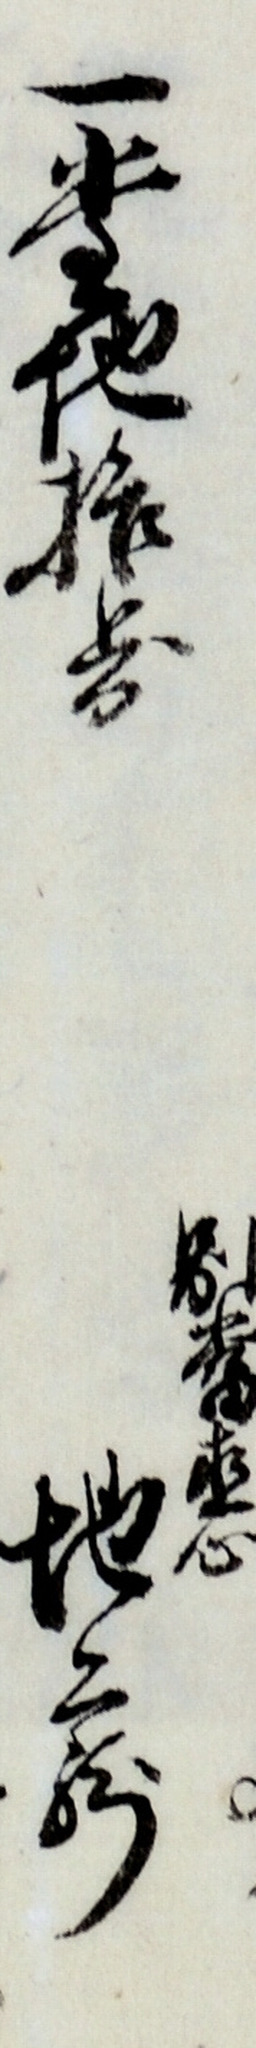一堂地拾歩地蔵
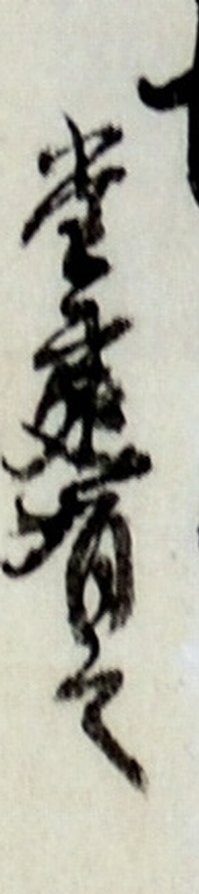堂建有之
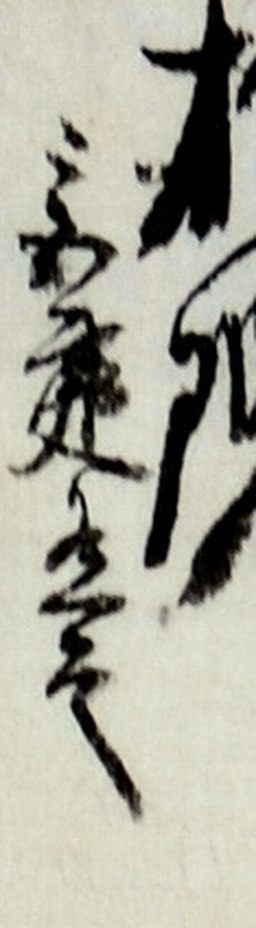宮建有之
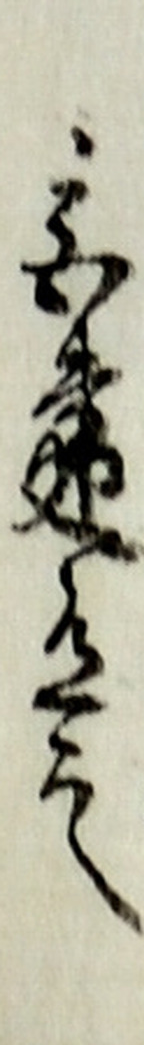宮建有之
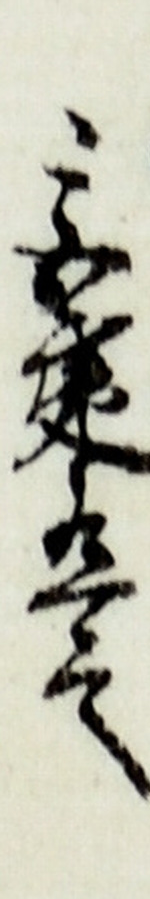宮建有之
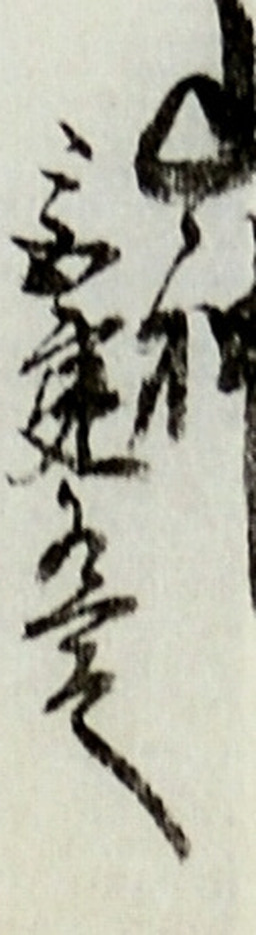宮建有之
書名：御領分中山林社地手控
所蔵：伊那市立高遠町図書館・合同会社AMANE
